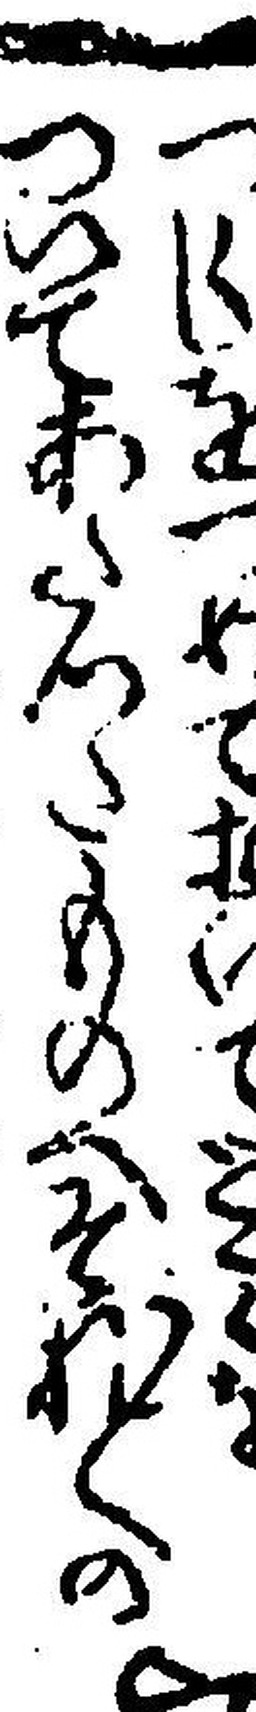ついてあたつたものへそれ〳〵の
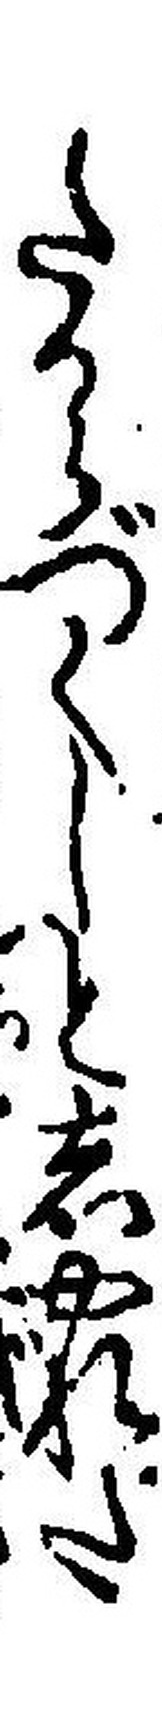たからづくしとしやれた
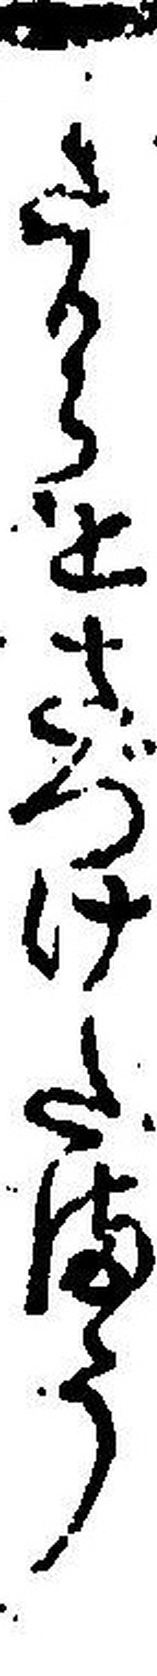たからをさづけたまう
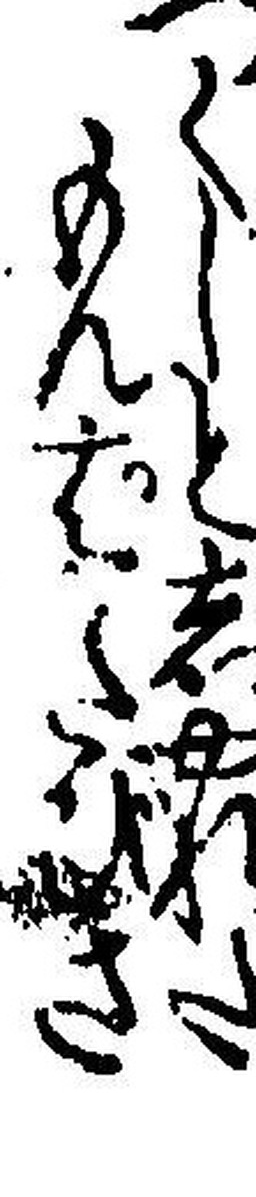もんぱたびさ
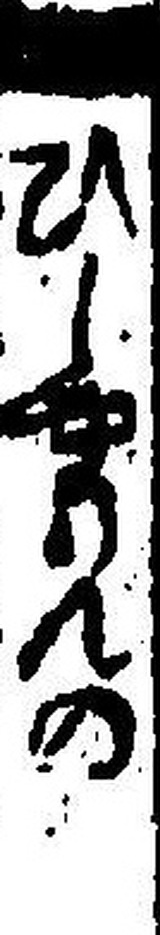ひしやもんの
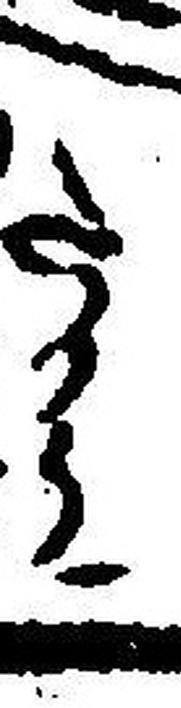たから
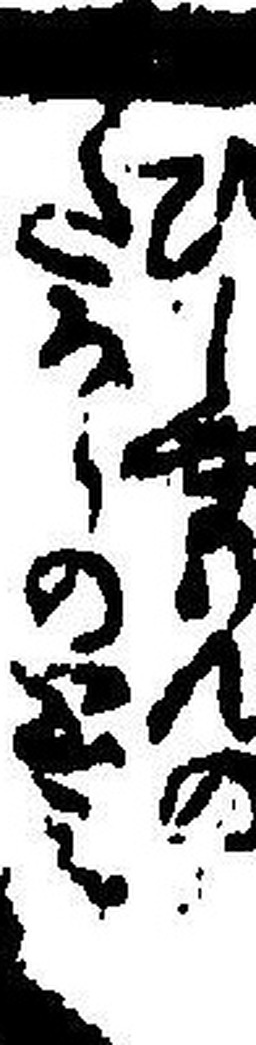たからのとみ
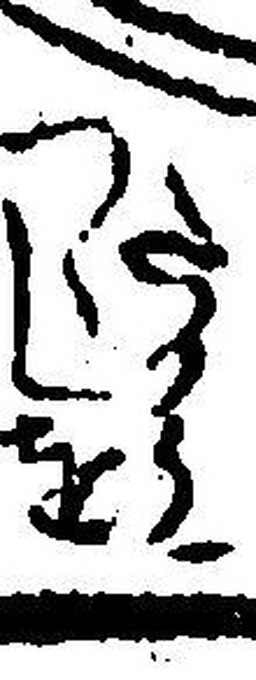つくしを
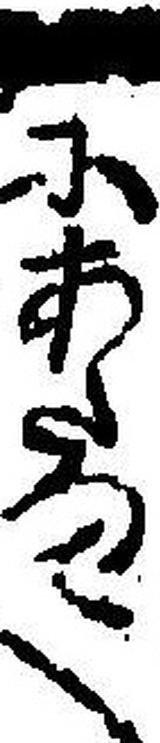にあたつて
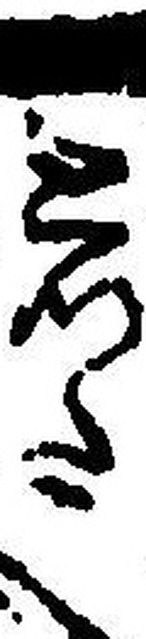とつた
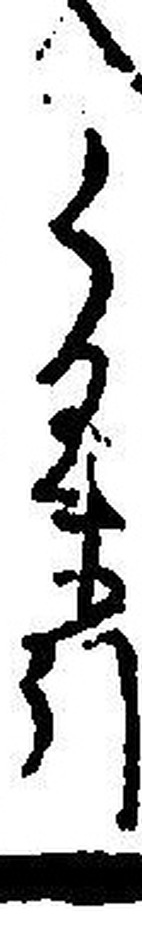くるま引
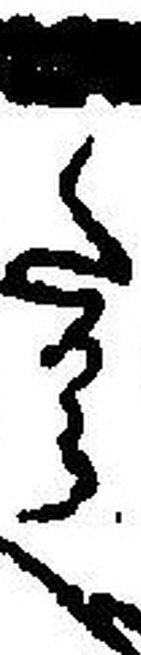たから
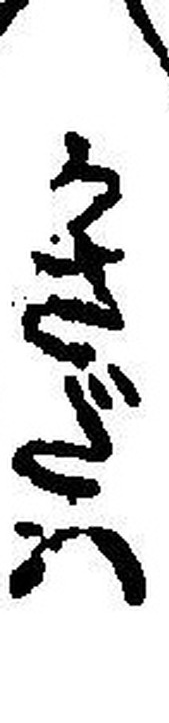かさだは
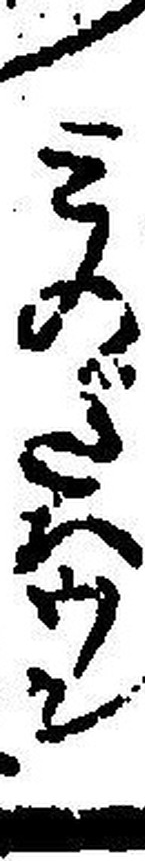みのたはウン
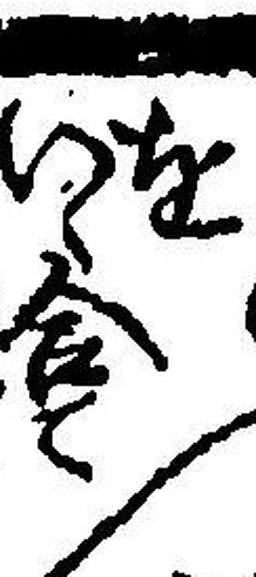いゝ合て
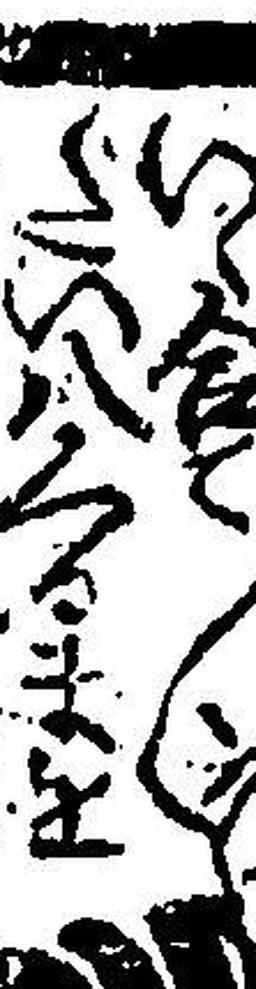たい八くるまを
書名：徳若水縁起金性 / 樹下石上作
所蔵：東京大学総合図書館 General Library in the University of Tokyo, JAPAN
